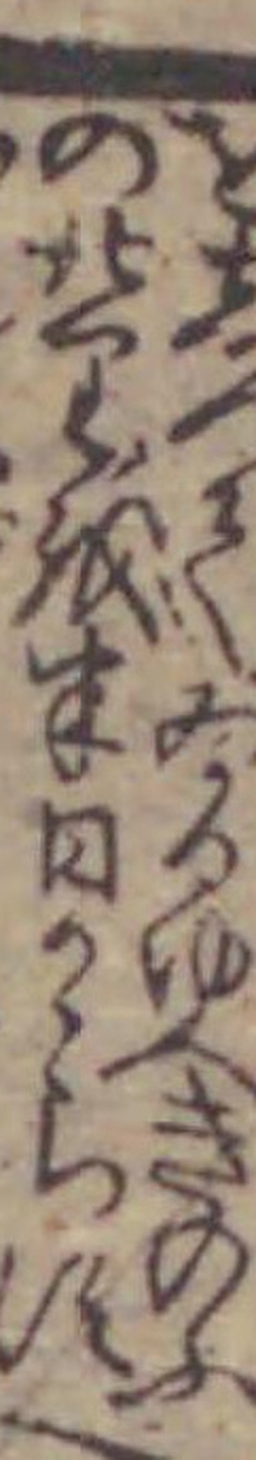の廿里を半日かゝらす
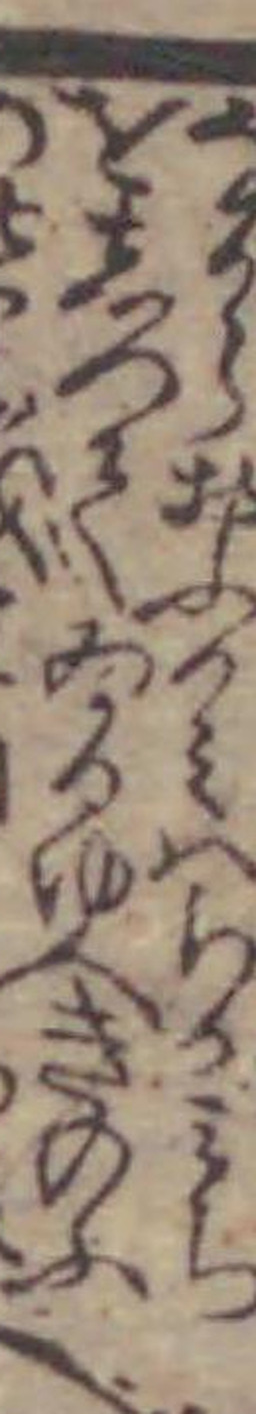をしつてゐるゆへきのふ
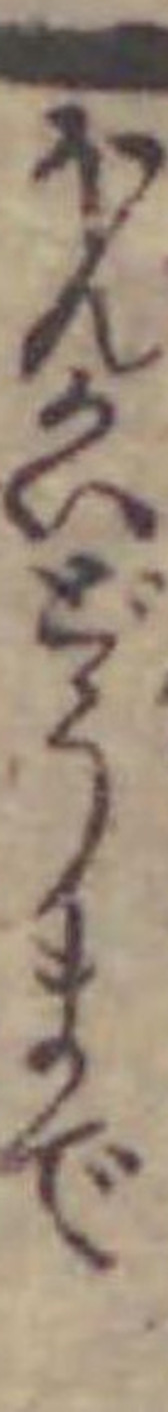ほんかいどうまで
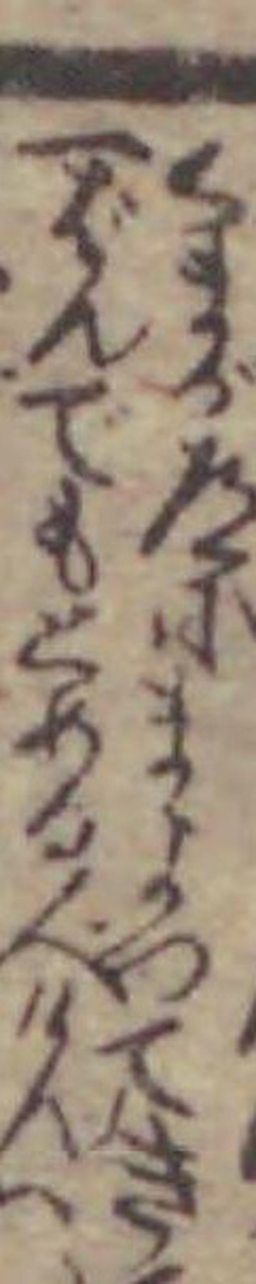一ばんでもとめる人けんは
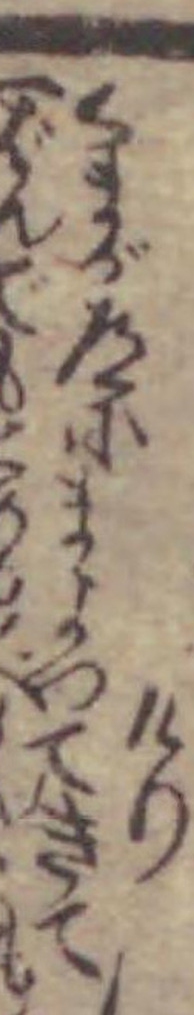くまが道にまよつてきても
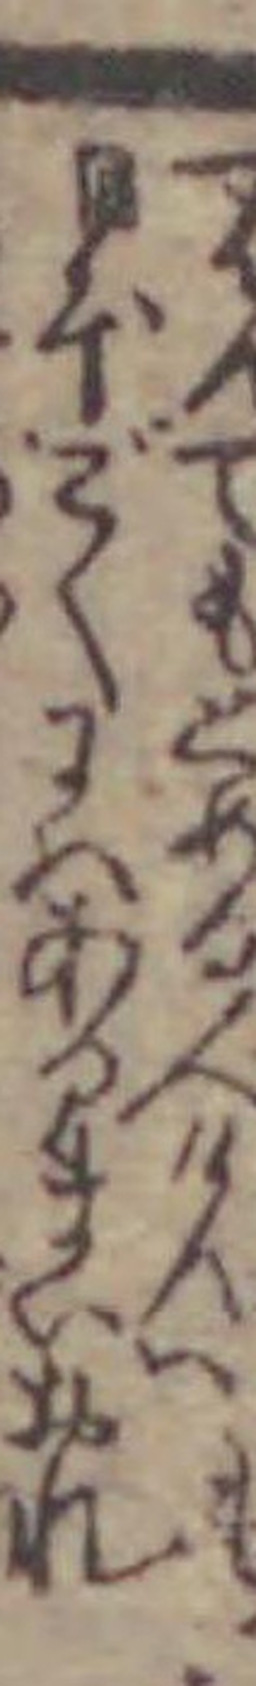日本ごくにはあるまいおれ
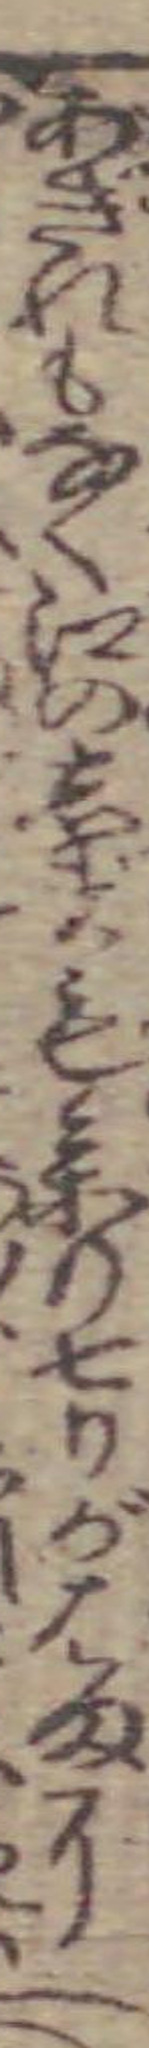あきれもなく江のしまも参り七りがはまに
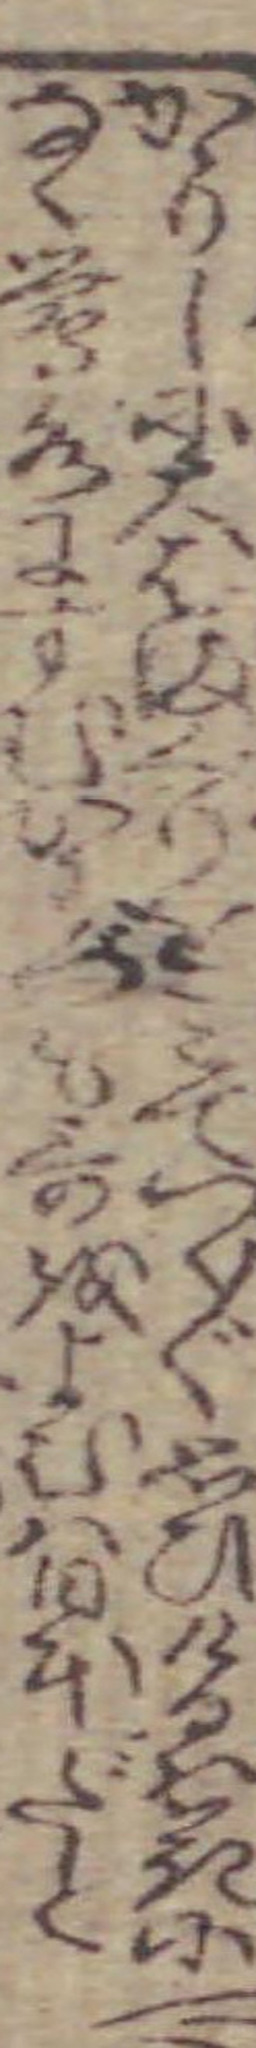なく鴬水にすむかわづも哥をよむは日本だと
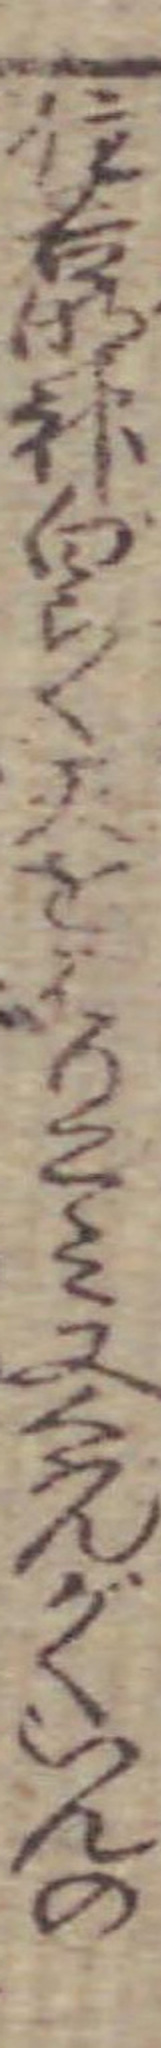住吉明神白らく天をはりこみ又くはんがくいんの
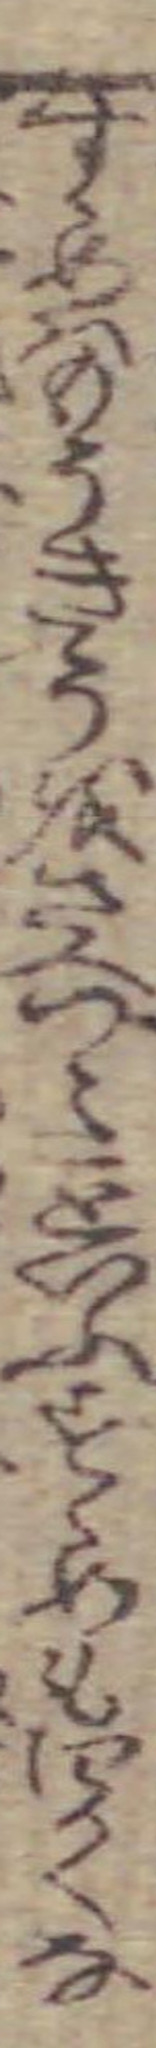すゝめはもうきうをさへづゝたといふすゞめも四かくな
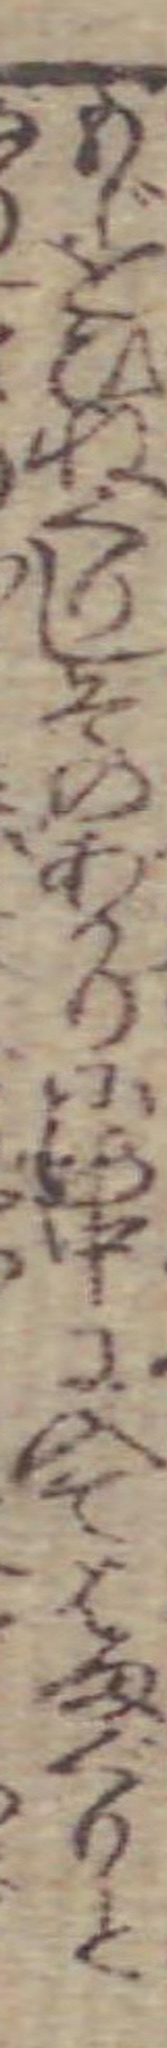もじをひねくりしそのあかりに海中に入りてはまぐりと
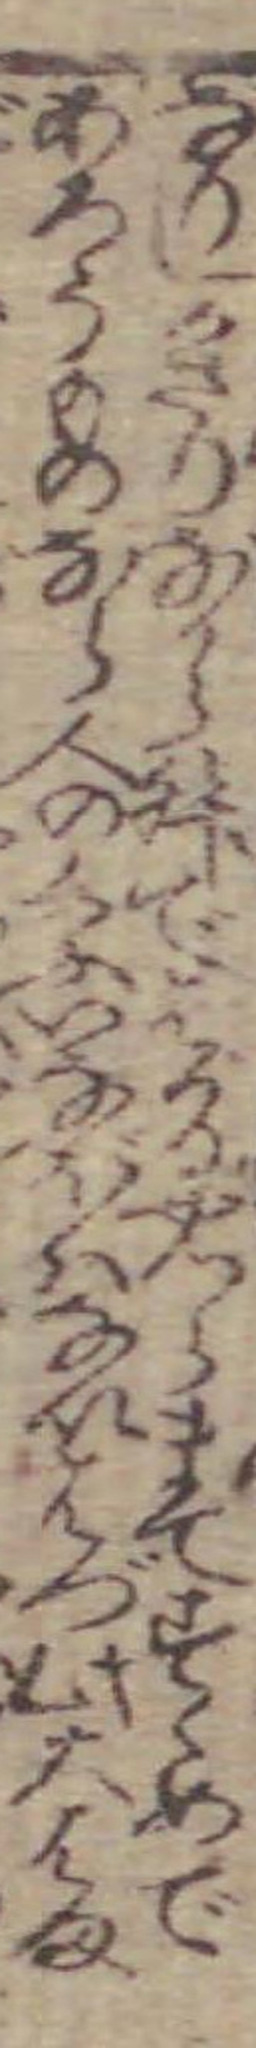あろうものなら人のくふいなぼはないはづ此大はま
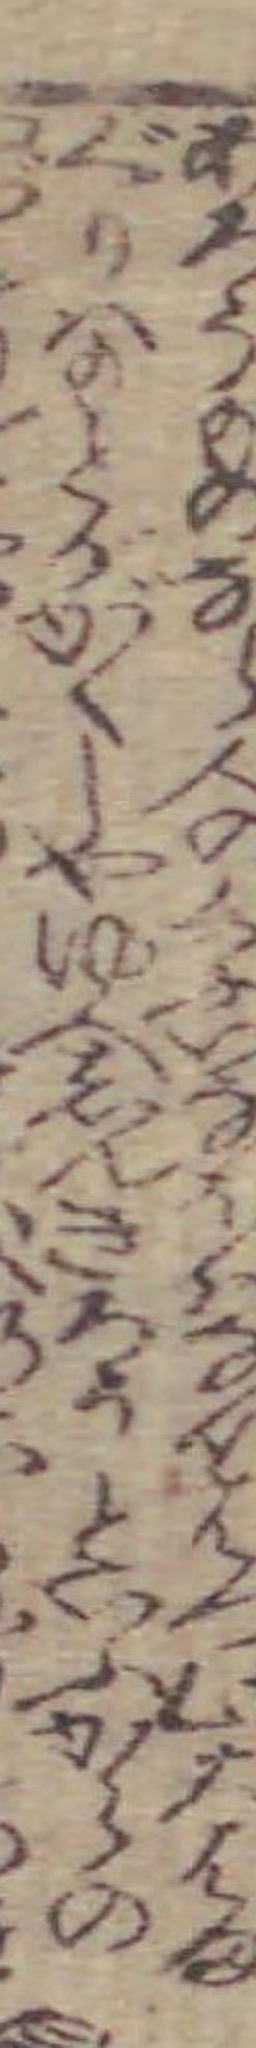ぐりはもとががくしやゆへしんきろうといふからの
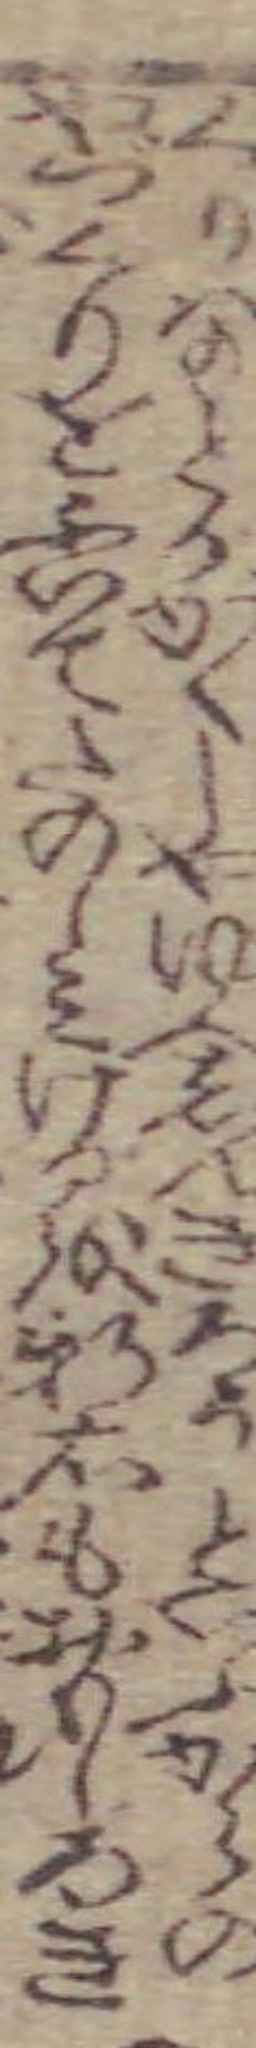やづくりをふいてたのしみけるを新右もおもしろき
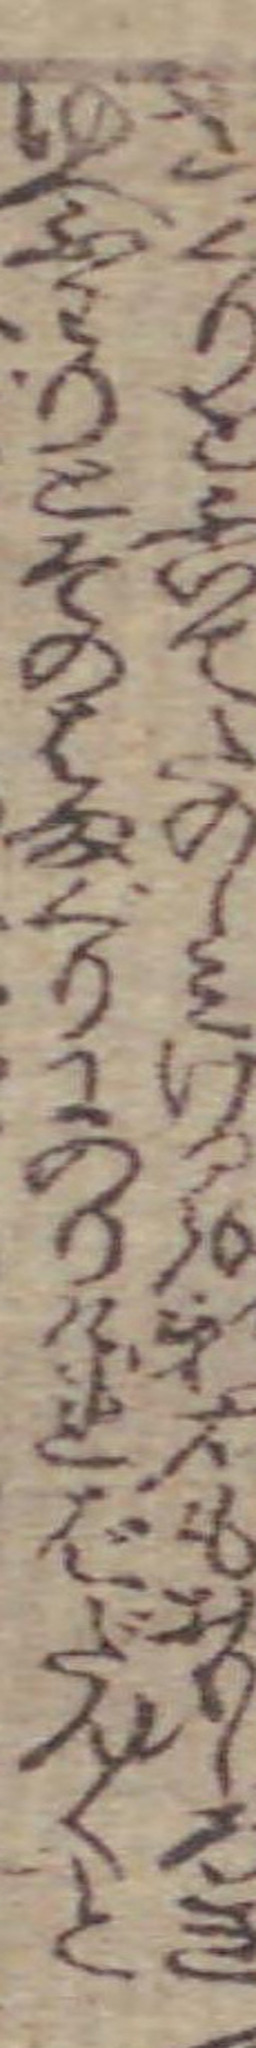ゆへふわりとそのはまぐりにのりければだん〳〵と
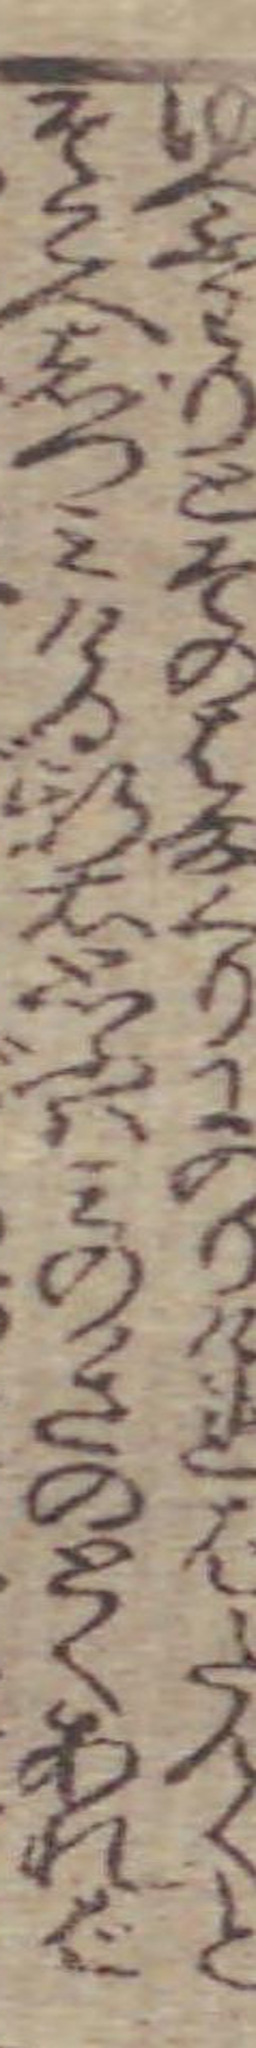そこへしつみける新右思ふはみのかさのとくあれば
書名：即席耳学問 : 3巻
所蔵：国立国会図書館 National Diet Library, JAPAN
